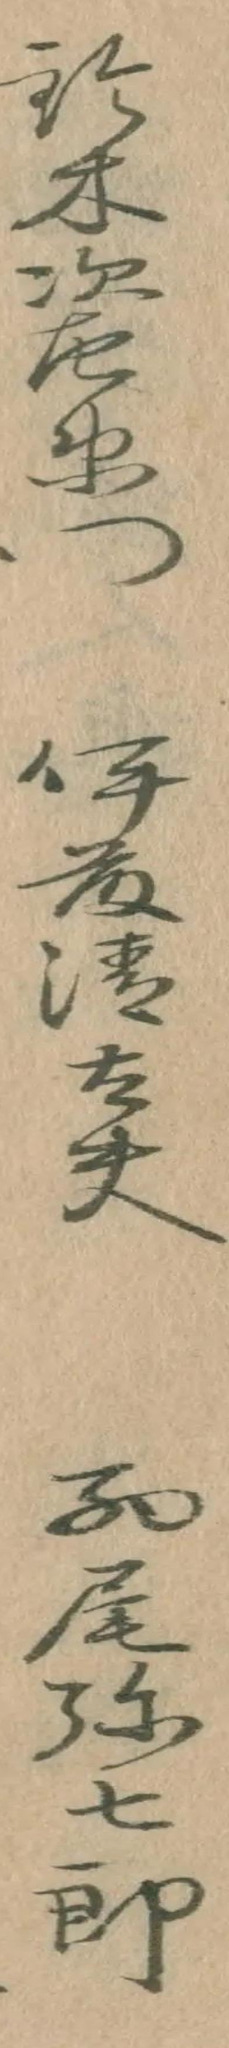鈴木次左衛門伊藤清太夫西尾弥七郎
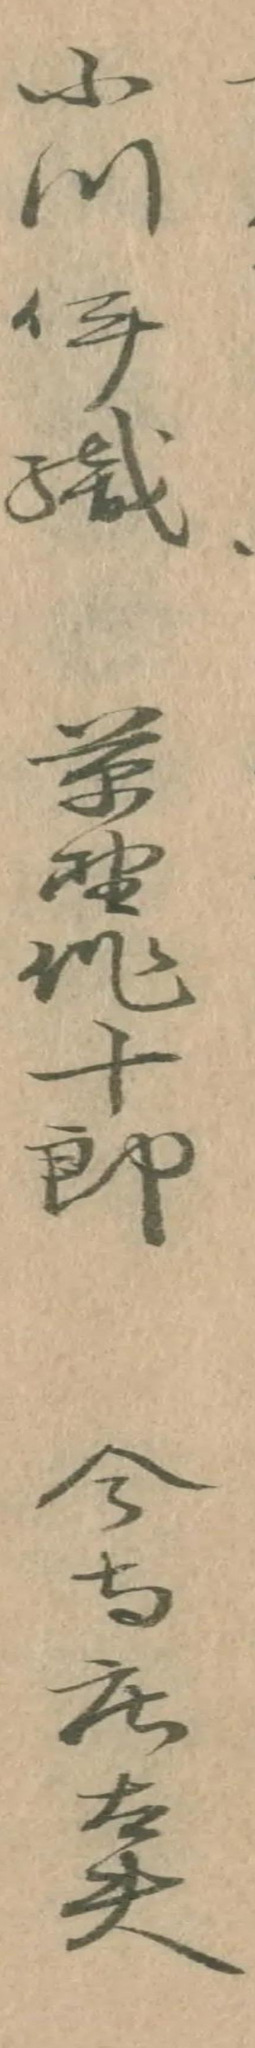小川伊織草野作十郎今寺庄太夫
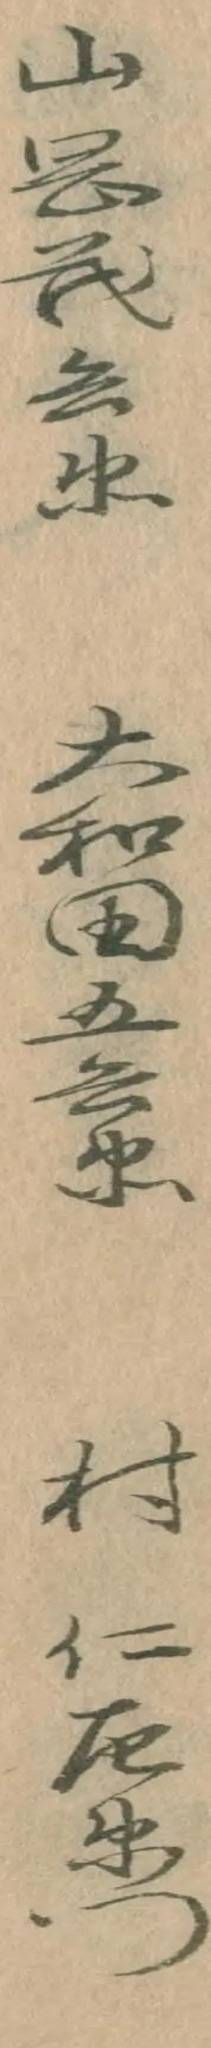山岡茂兵衛大和田五兵衛村仁左衛門

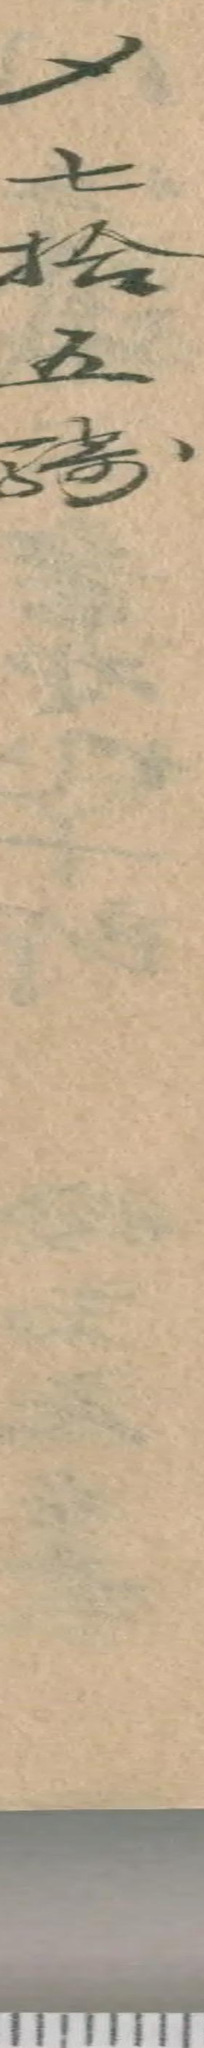〆七拾五騎
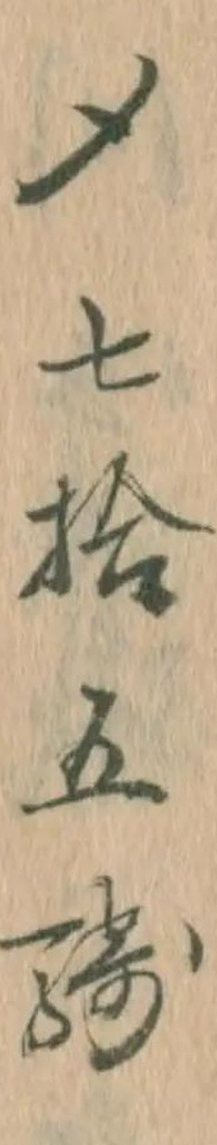〆七拾五騎
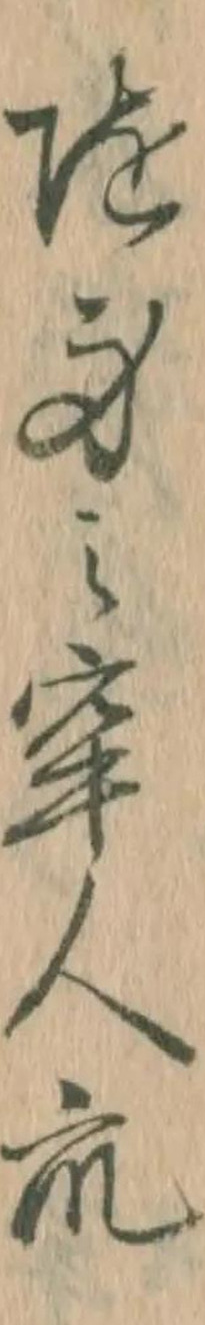随身之牢人衆
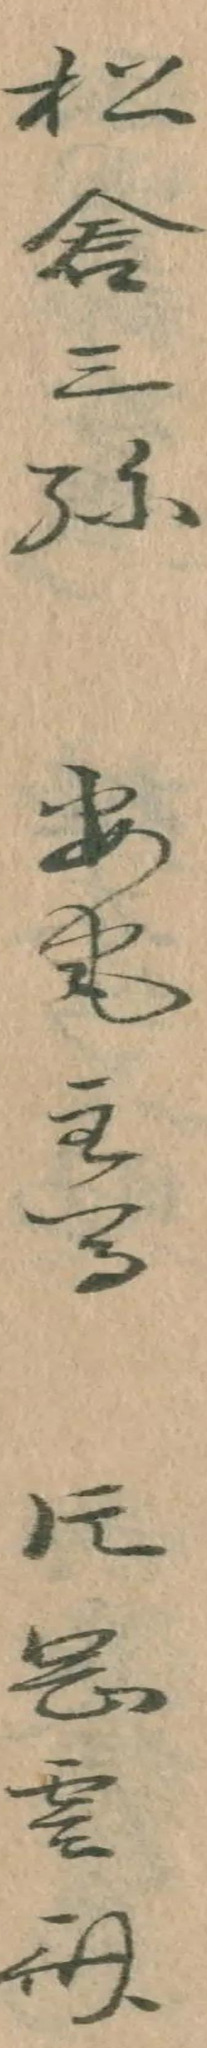松倉三弥安宅主馬片岡雲斎
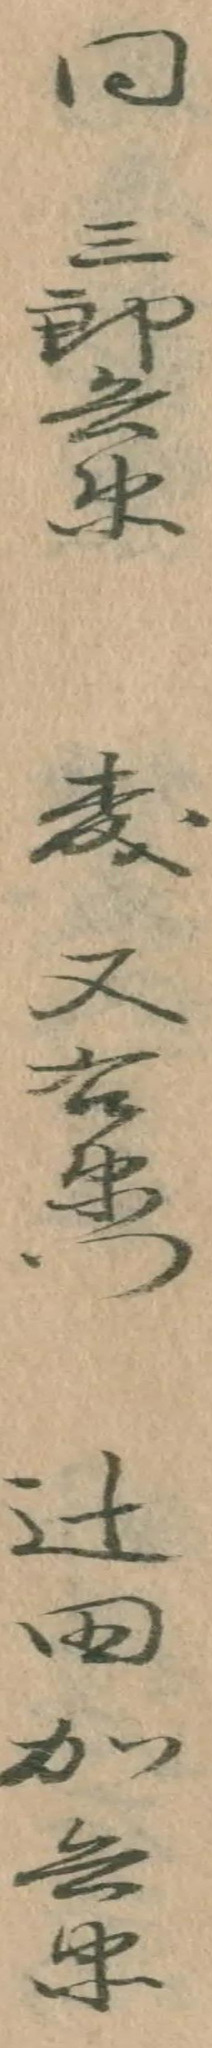同三郎兵衛森又右衛門辻田加兵衛
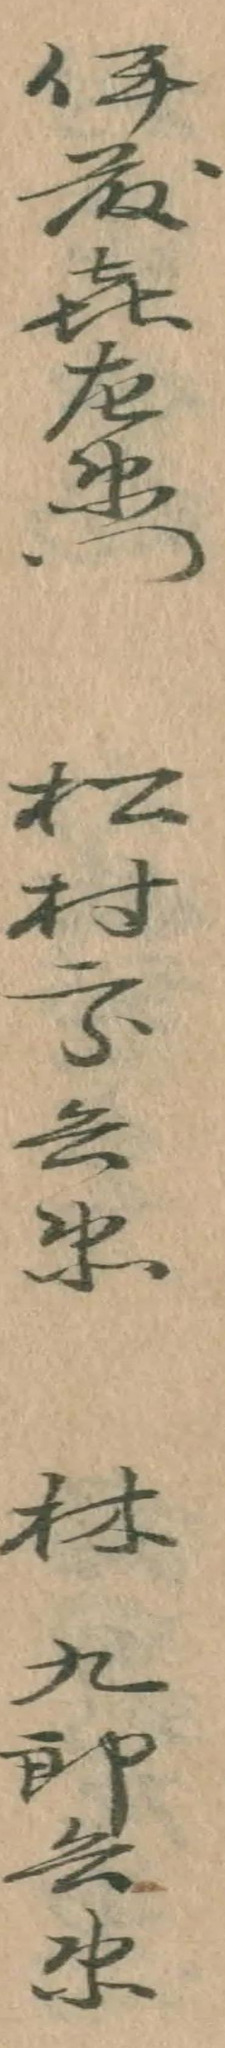伊藤喜左衛門松村高兵衛林九郎兵衛
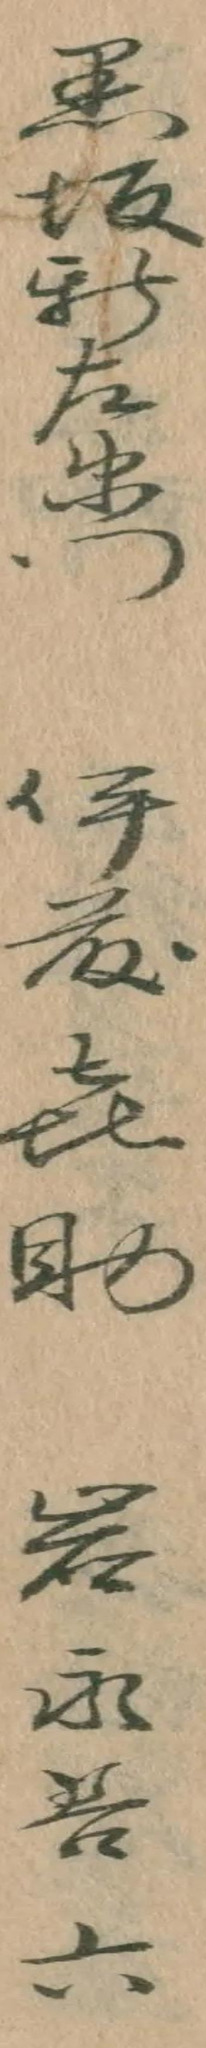黒坂新左衛門伊藤喜助岩永善六
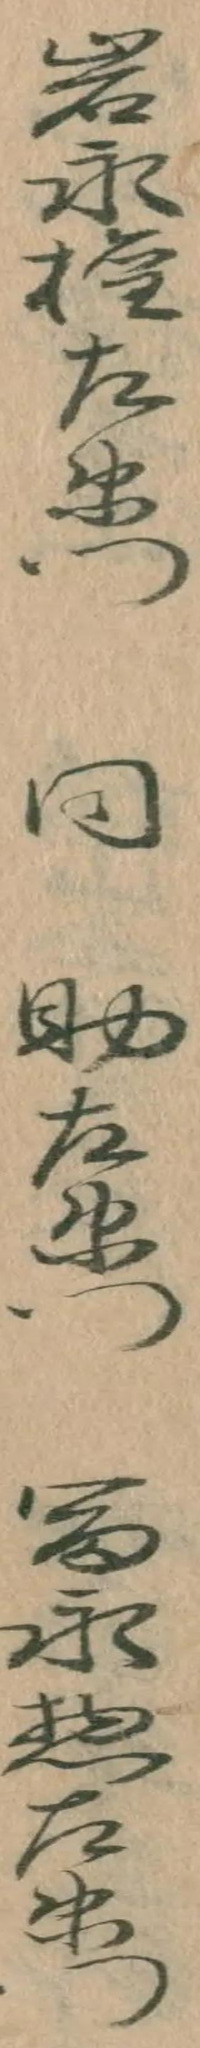岩水権左衛門同助左衛門富永惣左衛門
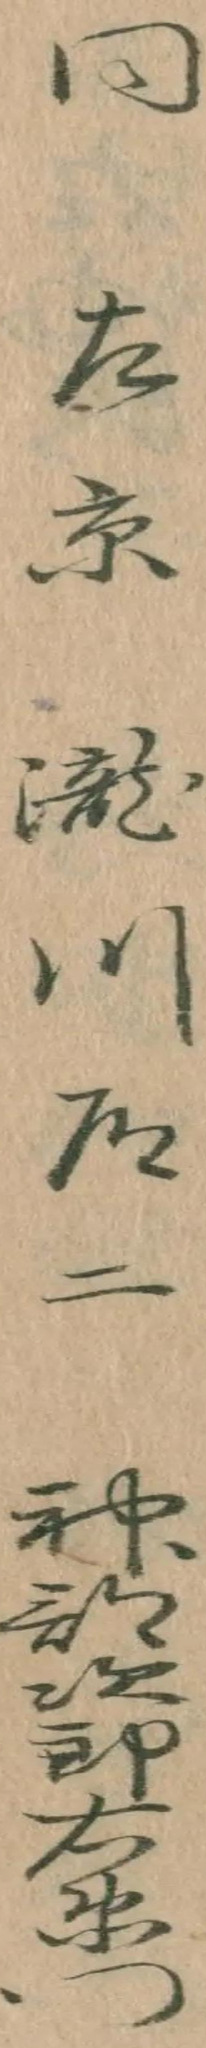同左京瀧川道二神部次郎右衛門
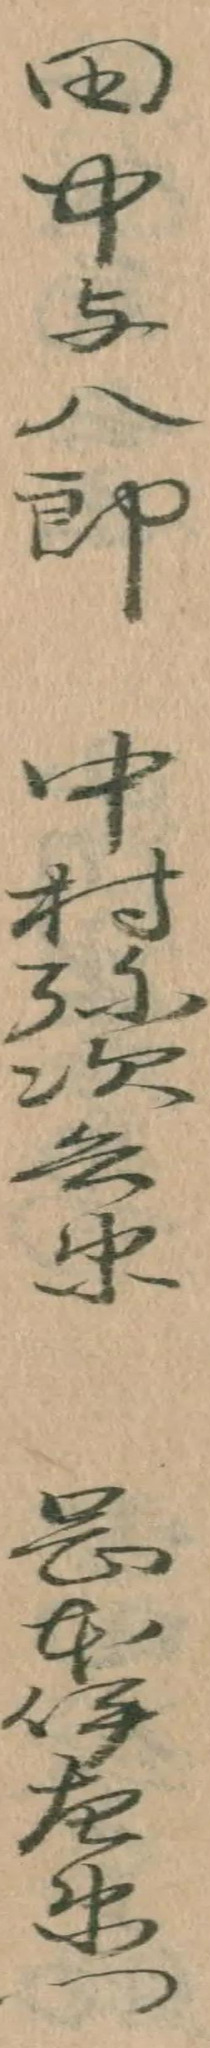田中与八郎中村弥次兵衛岡本伊左衛門
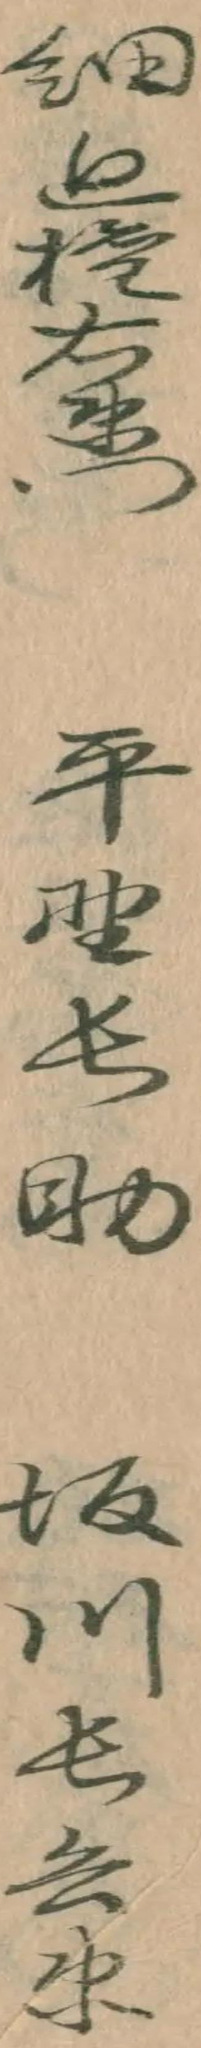細権右衛門平野長助坂川長兵衛
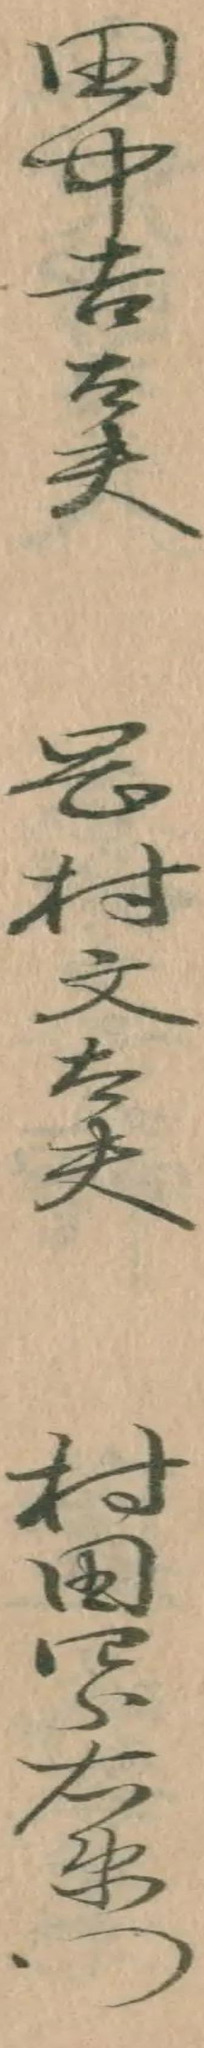田中吉太夫岡村文太夫村田四郎右衛門
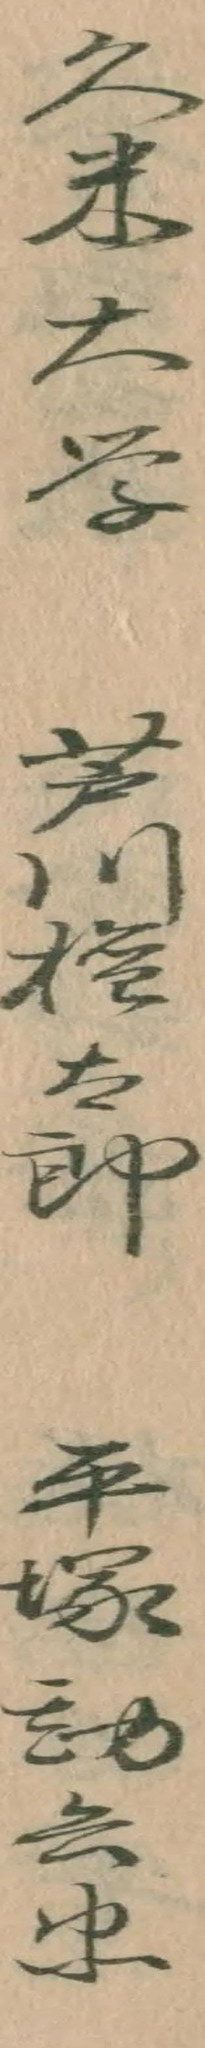久米大学芦川権太郎平塚勘兵衛
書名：切支丹御退治記 49巻. [3]
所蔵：国立国会図書館 National Diet Library, JAPAN
